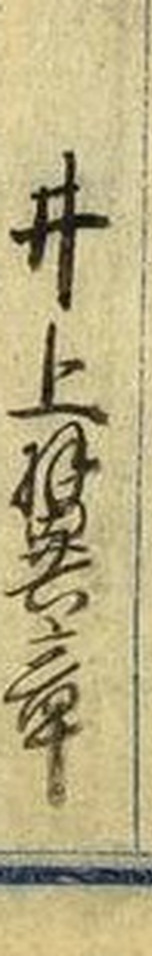井上翼章
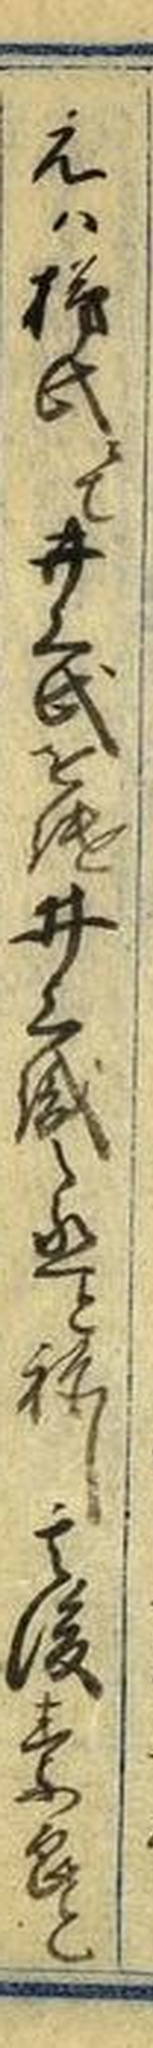元は梯氏にて井上氏を継井上威之丞と称し其後素良と
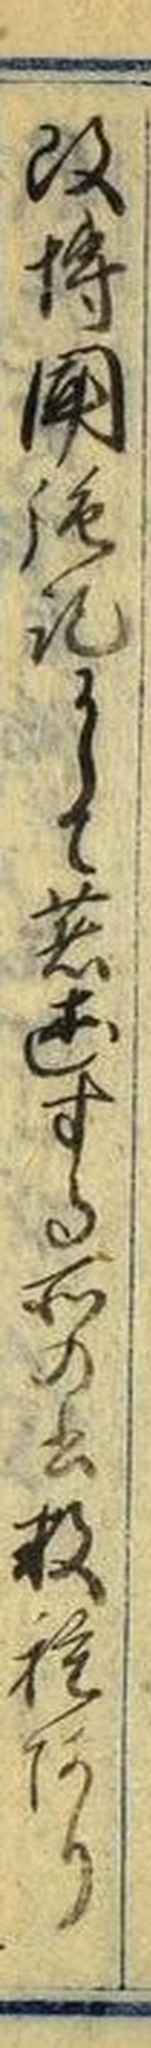改博聞強記にして著述する所の書数種あり

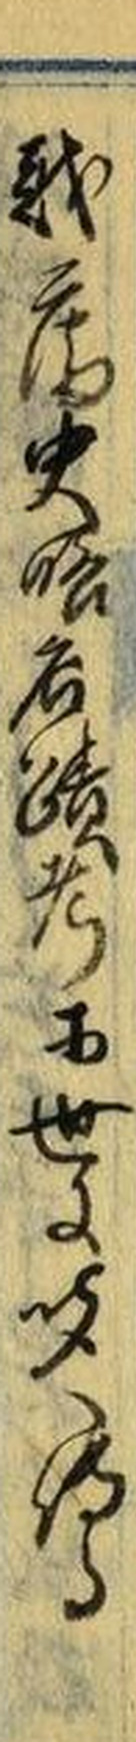越藩史略名蹟考等世に聞へ侍る
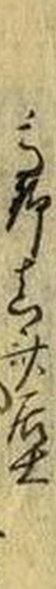高野真斎居士
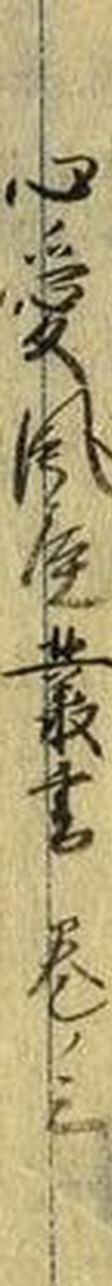心愛風屋叢書巻ノ三
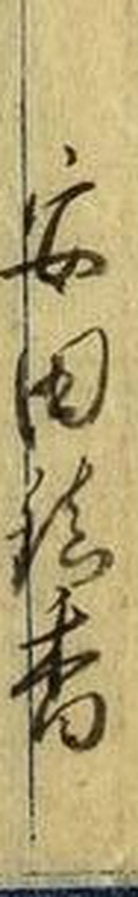安田鎮香
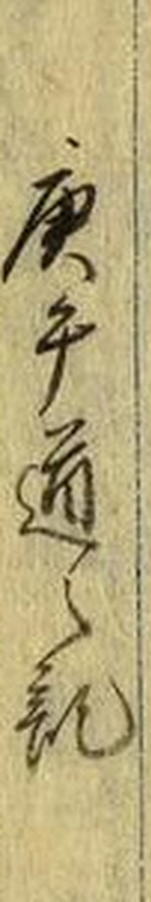庚午道之記
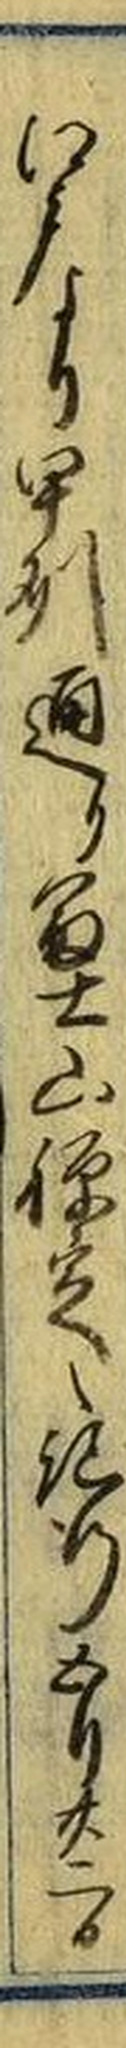江戸より甲州通り冨士山禅定之紀行五月廿二日
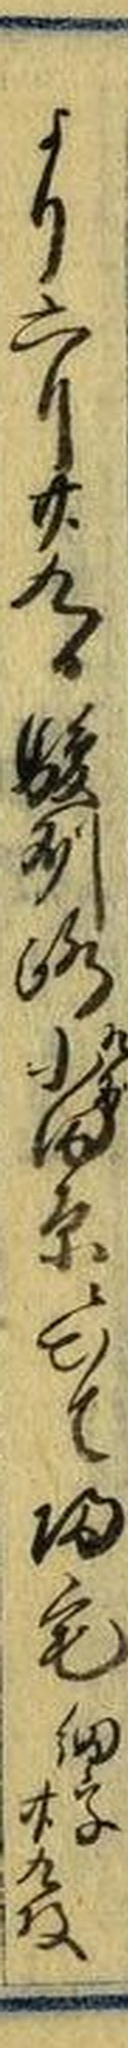より六月廿九日駿河路相州小田原に出て帰宅細字廿九枚
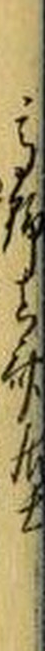高野真斎居士
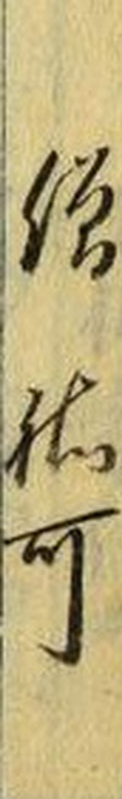僧祐可
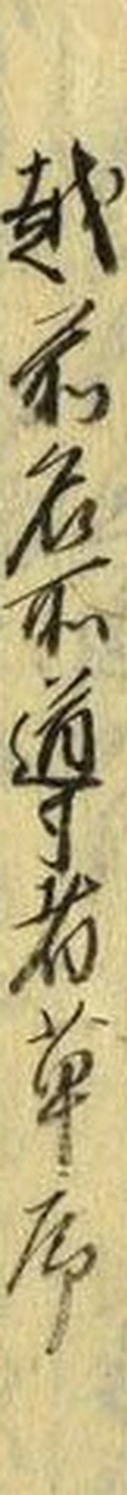越前名所導者草序
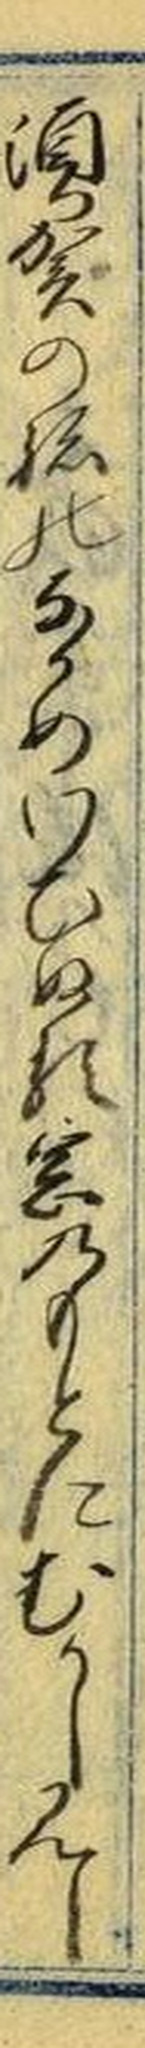須賀の跡のなかめわひぬる窓のもとにむかし見し
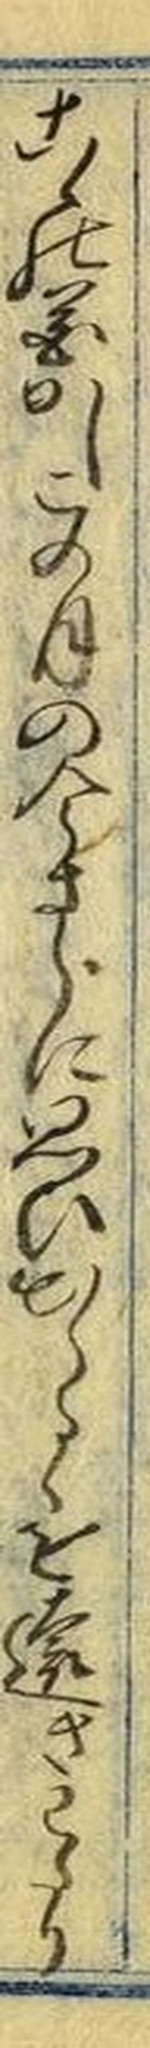こゝの花かしこの月の今さらに思ひ出らるゝを遠きわたり
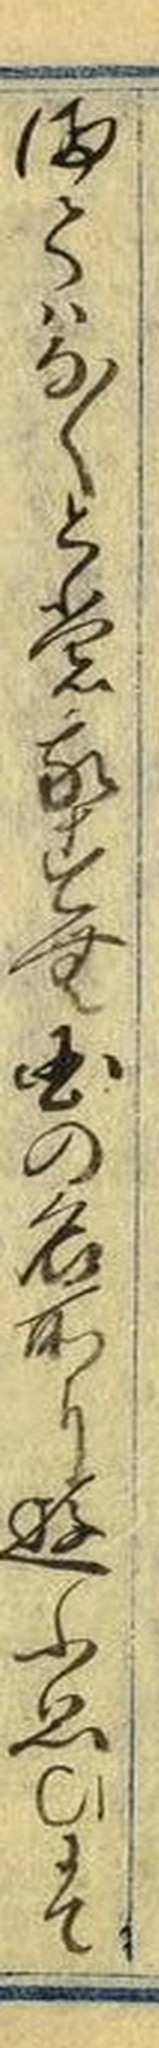まてはる〳〵ともかすむ国の名所に遊ふ思ひにて
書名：温古集 三巻
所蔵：福井県文書館 Fukui Prefectural Archives
